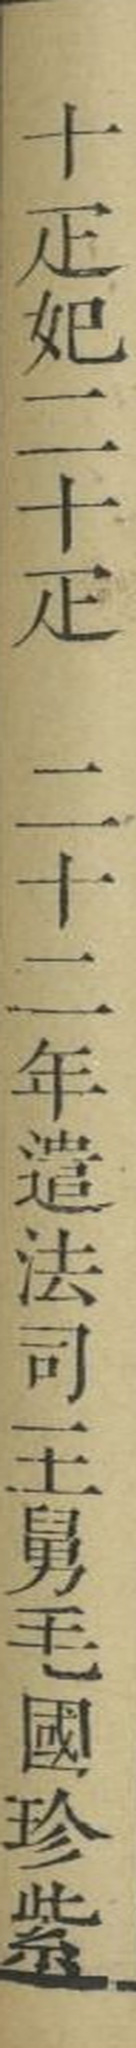十疋妃二十疋二十二年遣法司王舅毛国珍紫
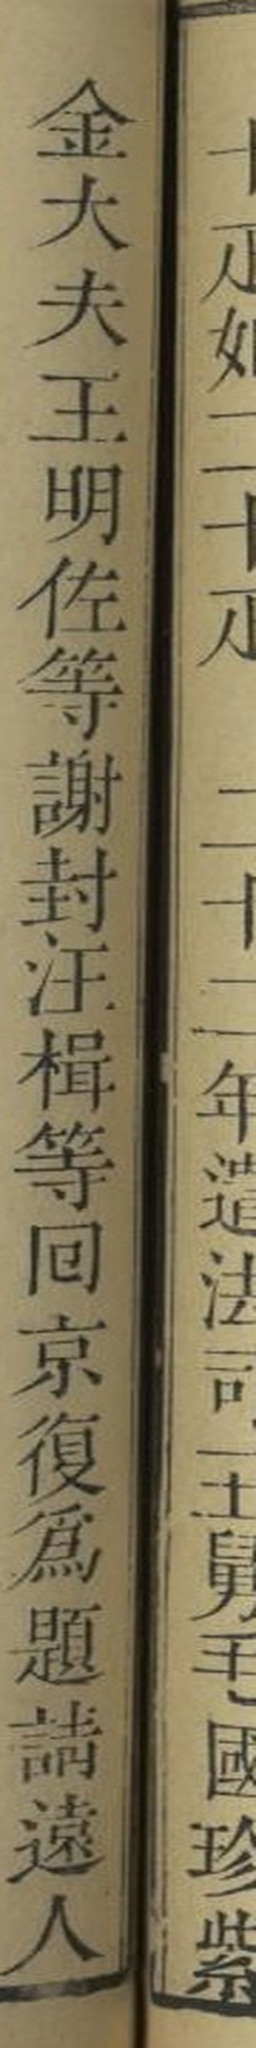金大夫王明佐等謝封汪楫等回京復為題請遠人
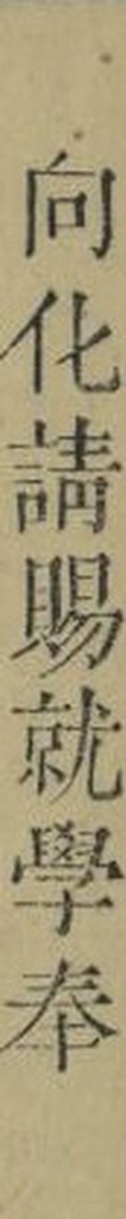向化請賜就学奉
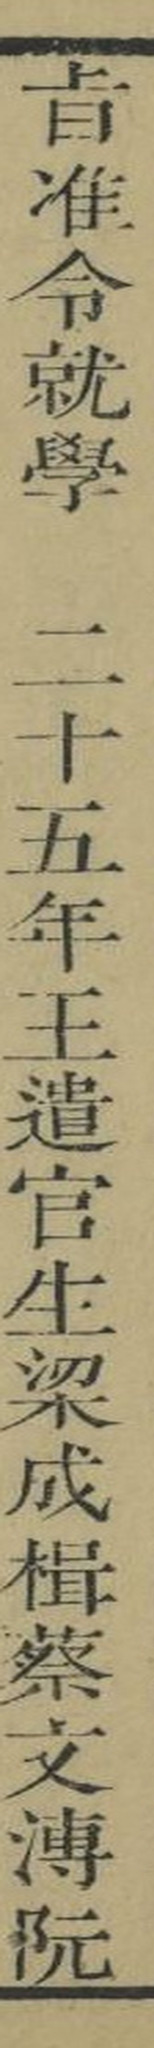旨准令就学二十五年王遣官生梁成楫蔡文溥阮
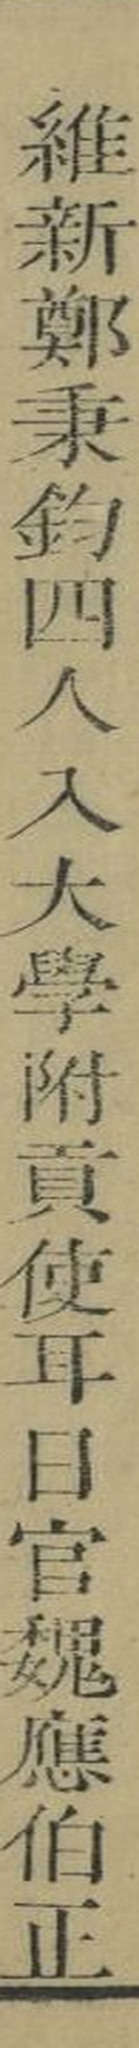維新鄭秉鈞四人入大学附貢使耳日官魏応伯正
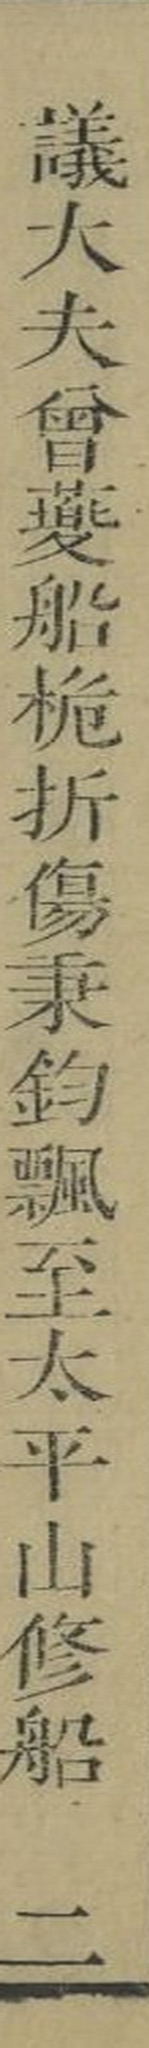議大夫曽䕫船桅折傷秉鈞飄至太平山修船二
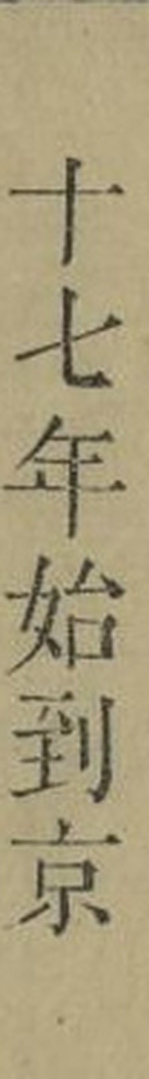十七年始到京
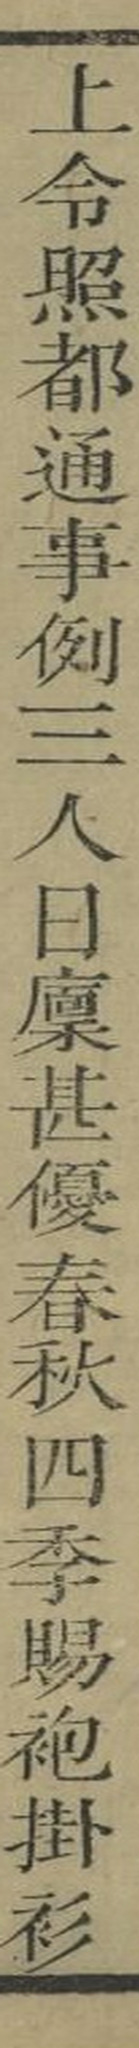上令照都通事例三人日廩甚優春秋四季賜袍掛衫
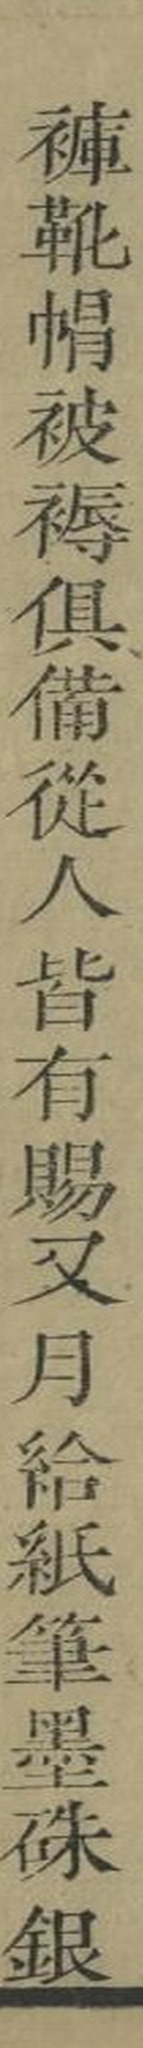褲靴帽被褥俱備従人皆有賜又月給紙筆墨硃銀
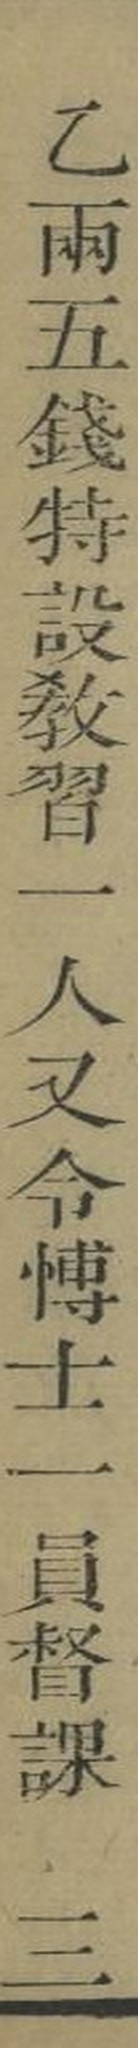乙両五銭特設教習一人又令博士一員督課三

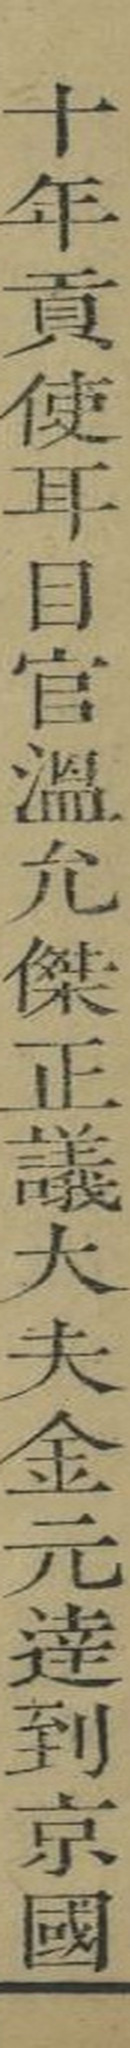十年貢使耳目官温允傑正議大夫金元達到京国
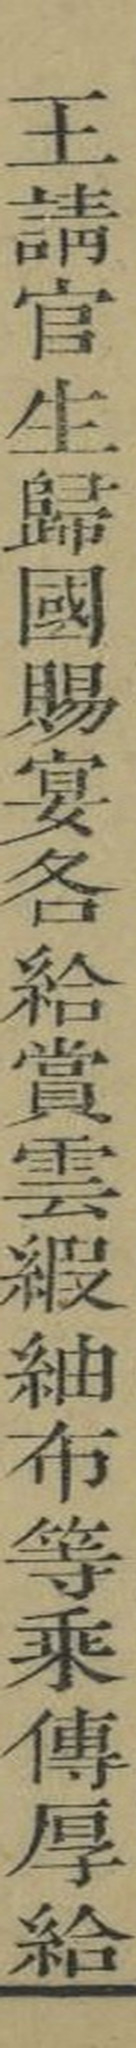王請官生帰国賜宴各給賞雲緞紬布等乗伝厚給
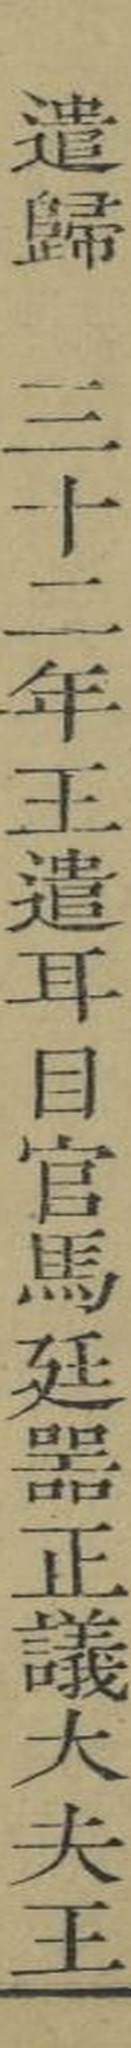遣帰三十二年王遣耳目官馬廷器正議大夫王
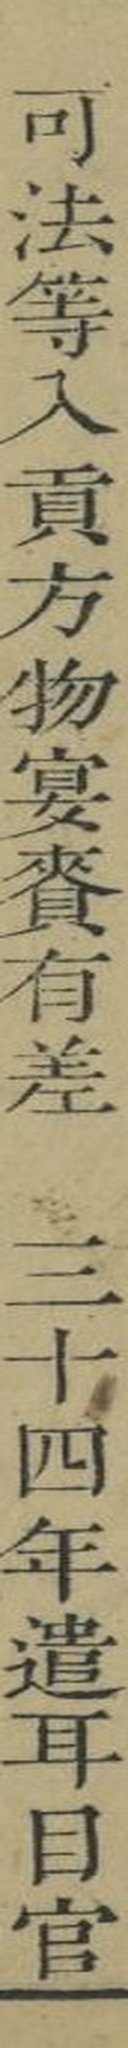可法等入貢方物宴賚有差三十四年遣耳目官
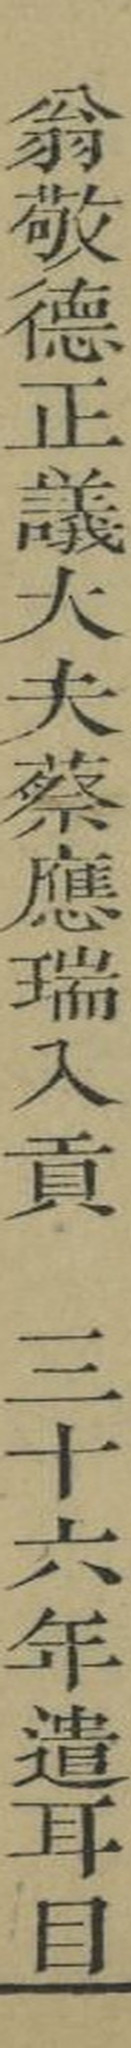翁敬徳正議大夫蔡応瑞入貢三十六年遣耳目
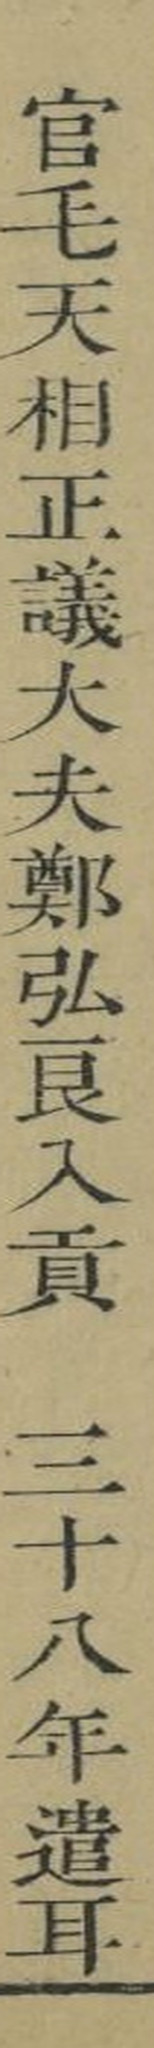官毛天相正議大夫鄭弘良入貢三十八年遣耳
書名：中山伝信録 巻三
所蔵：University of the Ryukyus Library
